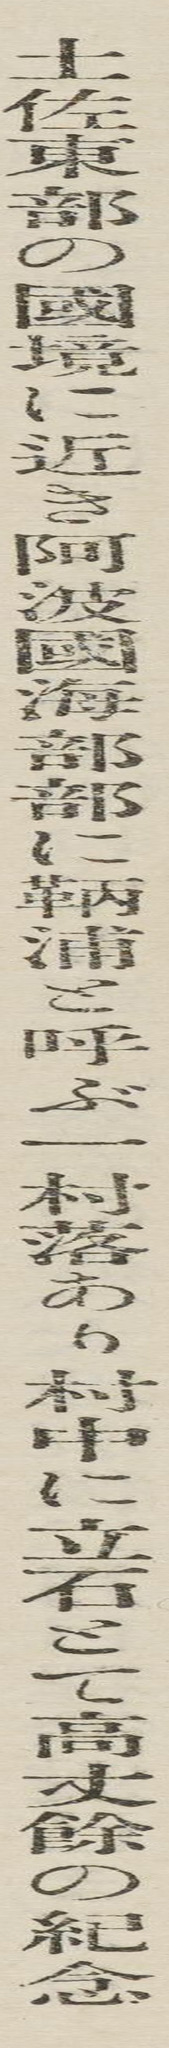土佐東部の国境に近き阿波国海部部に鞆浦と呼ぶ一村落あり村中に立石とて高丈余の紀念
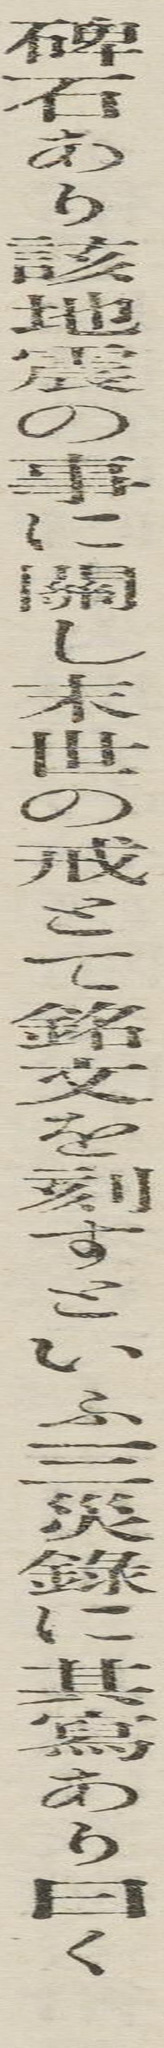碑石あり該地震の事に関し末世の戒とて銘文を刻すといふ三災録に其写あり曰く
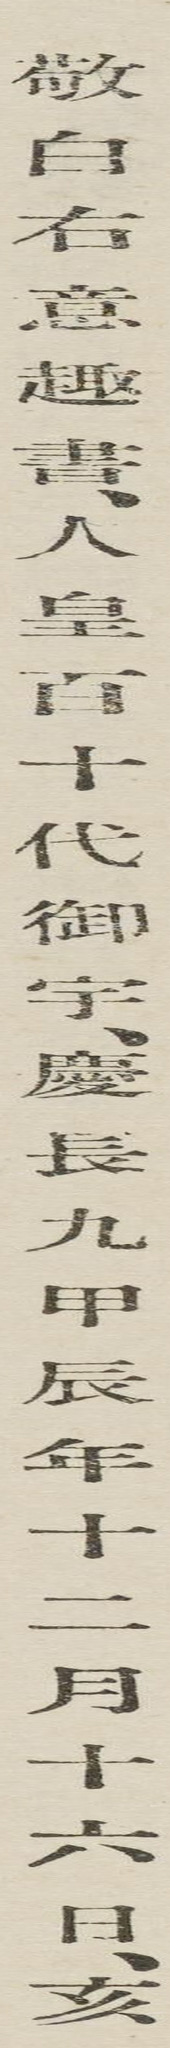敬白右意趣書、人皇百十代御宇、慶長九甲辰年十二月十六日、亥
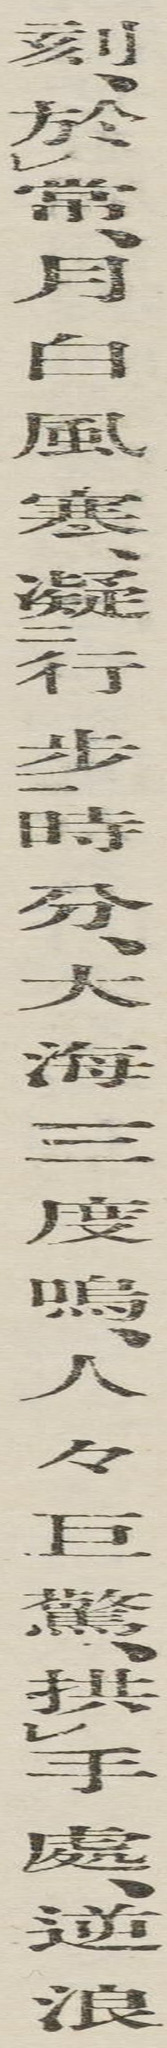刻、於常、月白風寒、凝行歩時分、大海三度鳴、人々巨驚、拱手処、逆浪
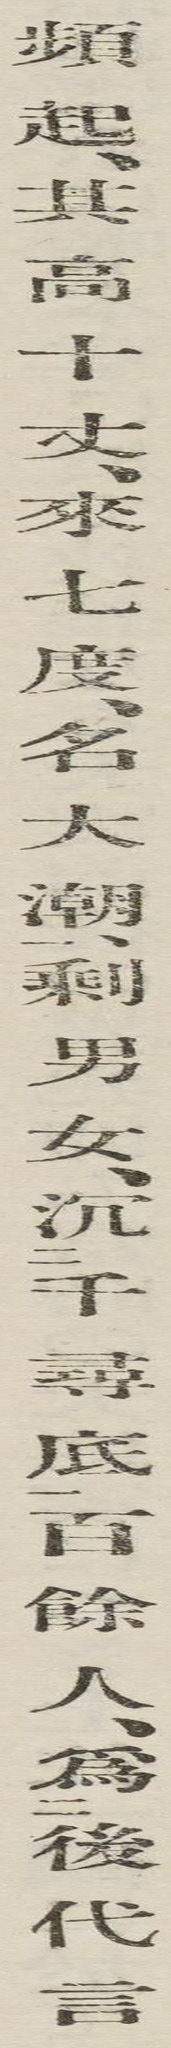頻起、其高十丈、来七度、名大潮、剰男女、沉千尋底百余人、為後代言
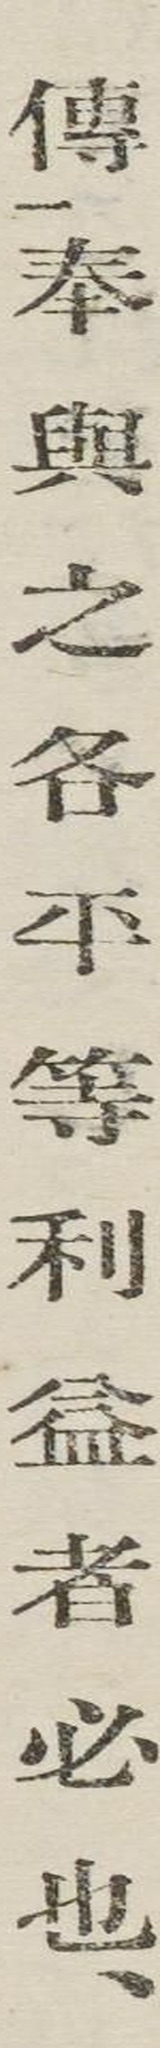伝奉与之各平等利益者必也、
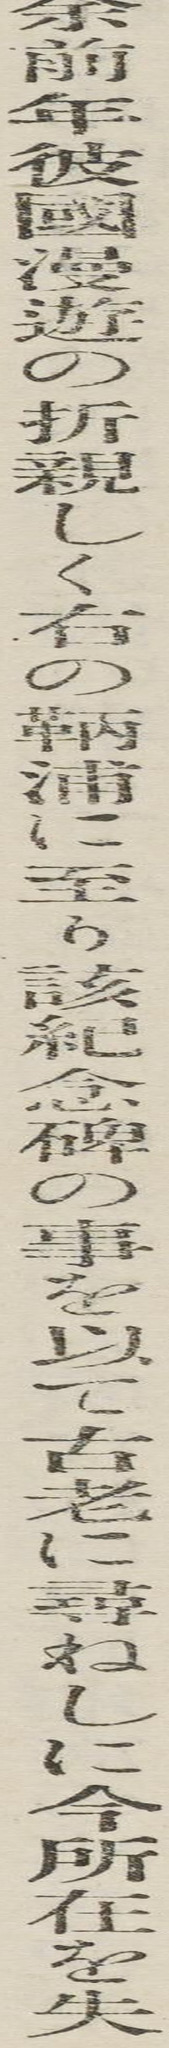余前年彼国漫遊の折親しく右の鞆浦に至り該紀念碑の事を以て古老に尋ねしに今所在を失
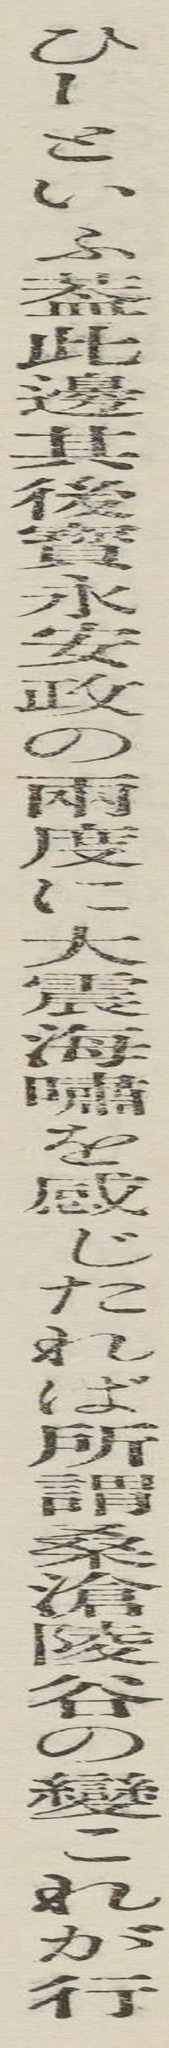ひしといふ葢此辺其後宝永安政の両度に大震海嘯を感じたれば所謂桑滄陵谷の変これが行
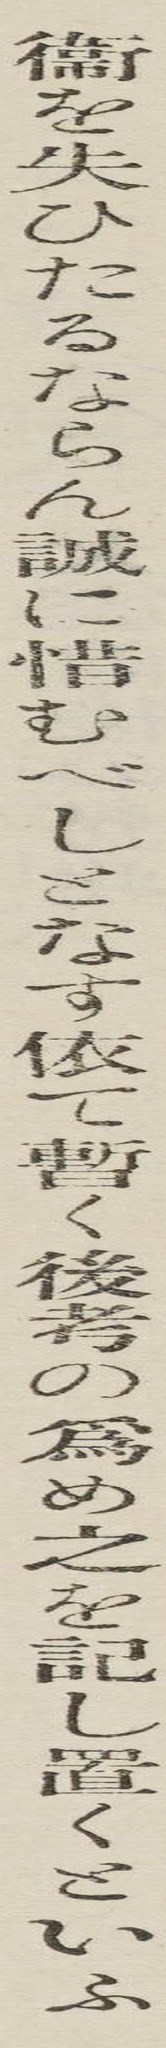衛を失ひたるならん誠に惜しむべしとなす依て暫く後考の為め之を記し置くといふ
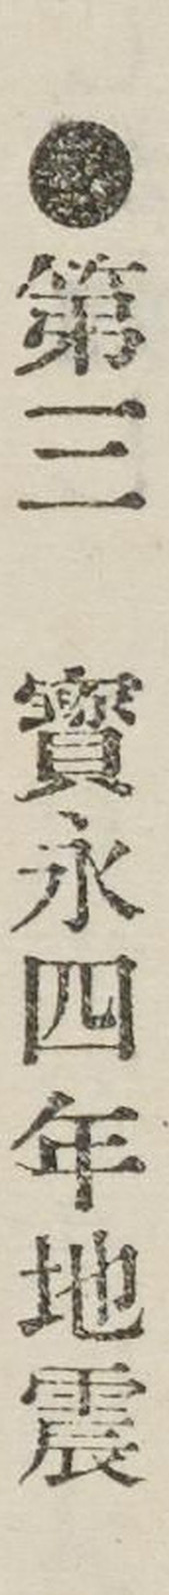●第三宝永四年地震
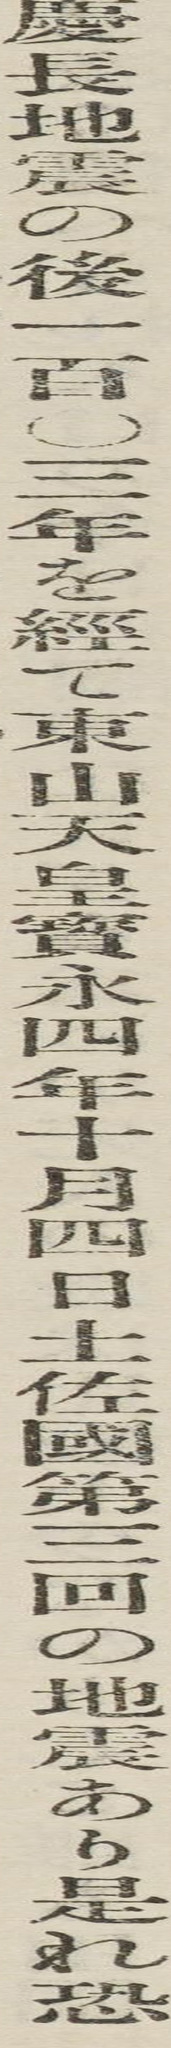慶長地震の後一百〇三年を経て東山天皇宝永四年十月四日土佐国第三回の地震あり是れ恐
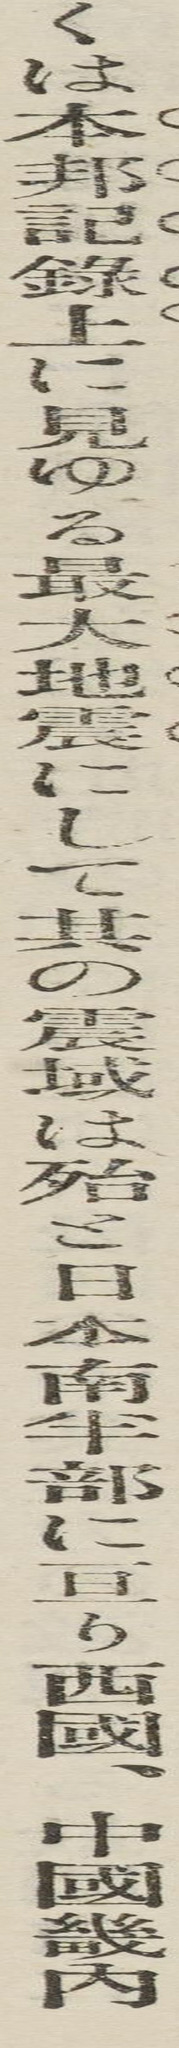くは本邦記録上に見ゆる最大地震にして其の震域は殆と日本南半部に亘り西国、中国畿内

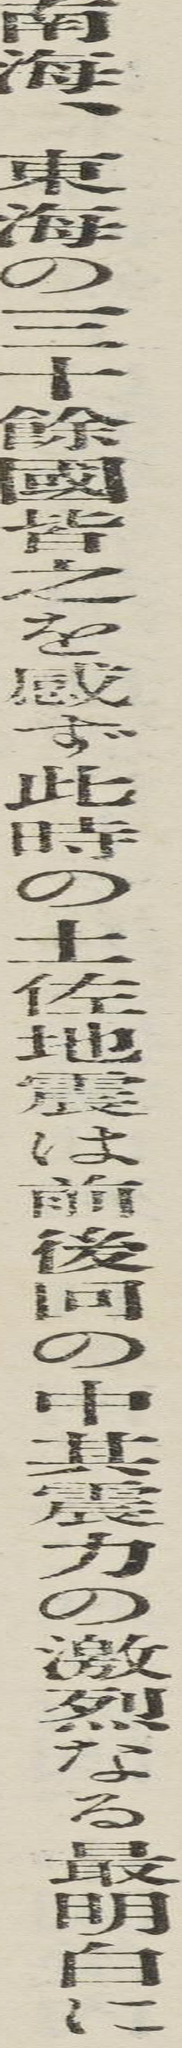南海、東海の三十余国皆之を感ず此時の土佐地震は前後回の中其震力の激烈なる最明白に
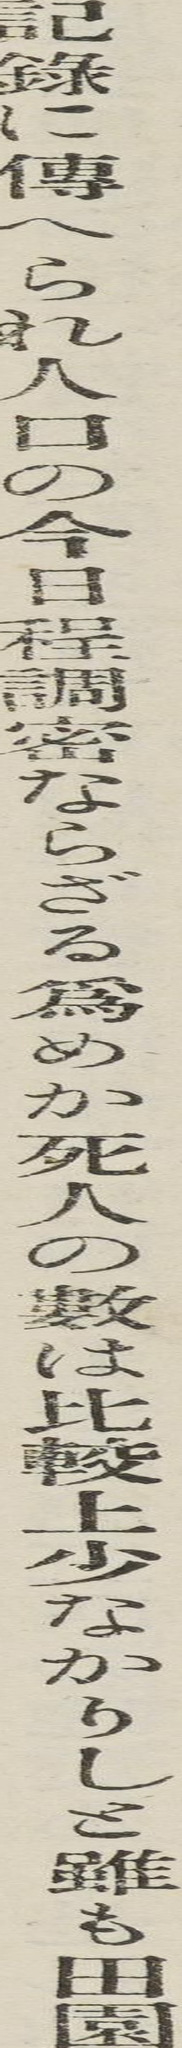記録に伝へられ人口の今日程調密ならざる為めか死人の数は比較上少なかりしと雖も田園
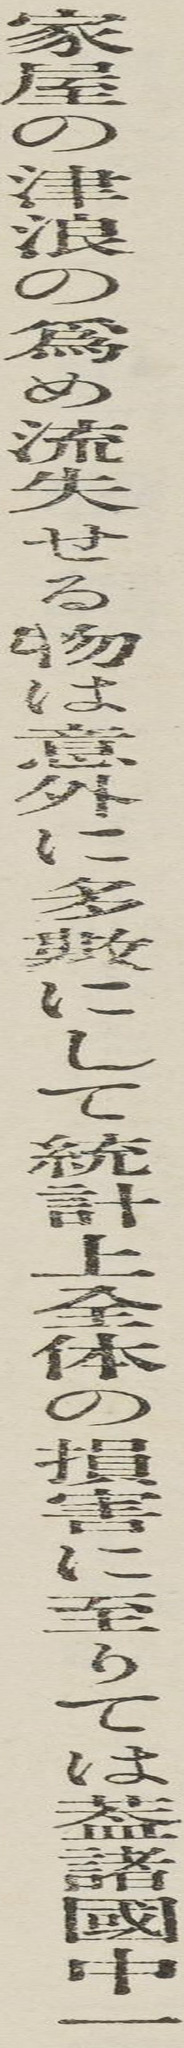家屋の津浪の為め流失せる物は意外に多数にして統計上全体の損害に至りては葢諸国中一
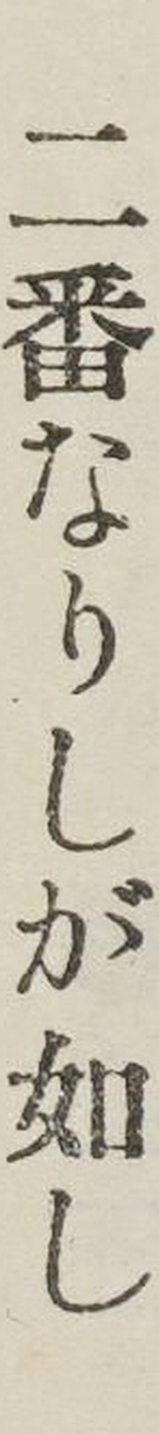二番なりしが如し
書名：土佐古今ノ地震
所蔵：東京大学地震研究所図書室 Earthquake Research Institute Library, The University of Tokyo, JAPAN
